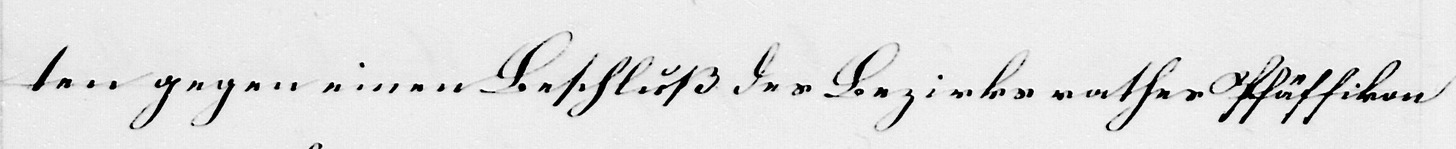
ten gegen einen Beschluß des Bezirksrathes Pfäffikon
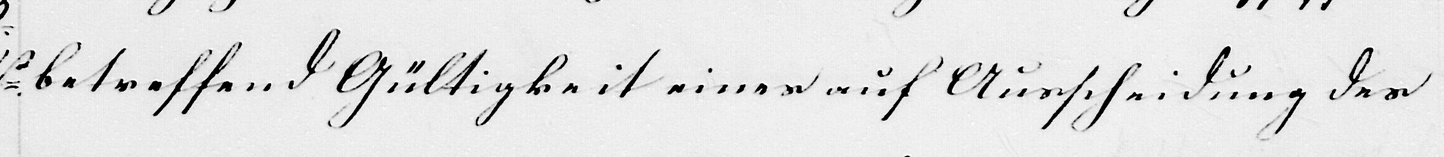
betreffend Gültigkeit eines auf Ausscheidung des
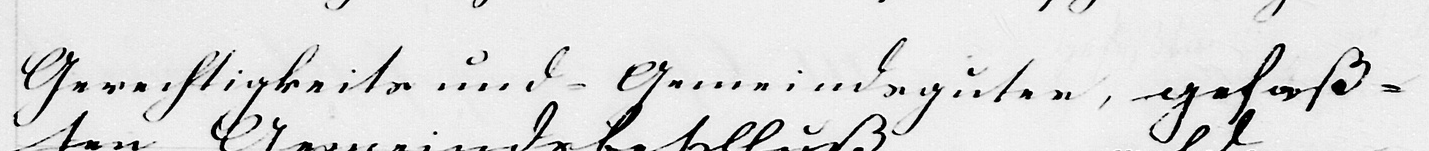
Gerechtigkeits und Gemeindsgutes, gefaß¬
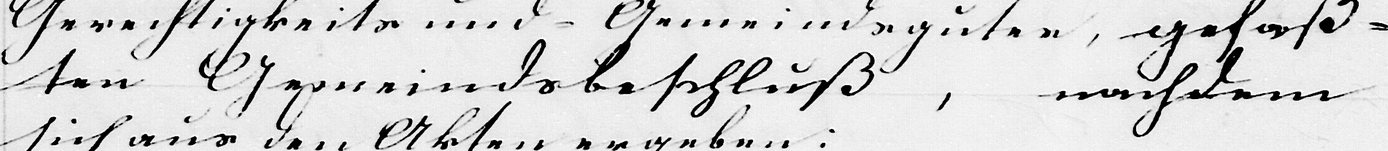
ten Gemeindsbeschluß, nachdem
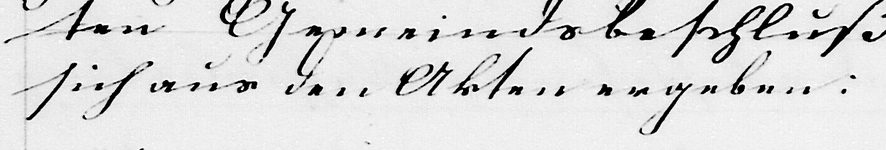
sich aus den Akten ergeben:
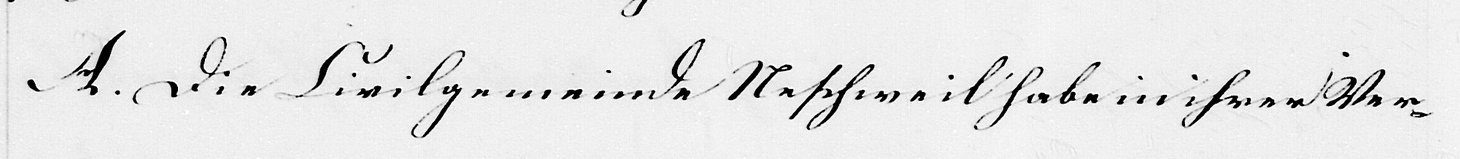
A. Die Civilgemeinde Neschweil habe in ihrer Ver¬
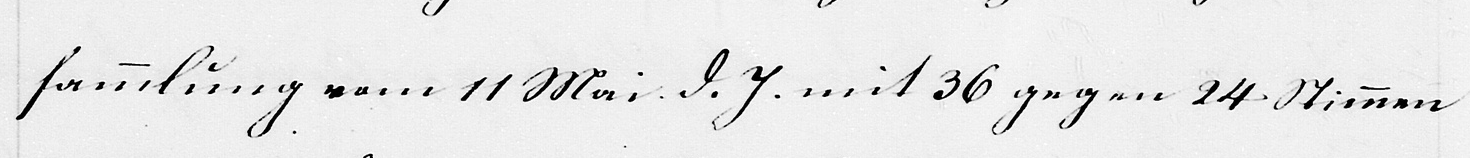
sammlung vom 11 Mai d. J. mit 36 gegen 24 Stimmen
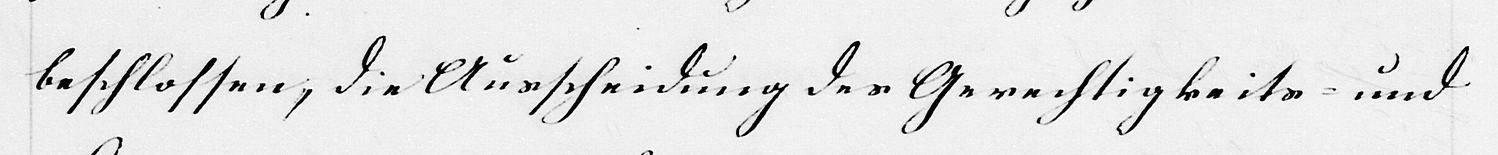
beschlossen, die Ausscheidung des Gerechtigkeits- und
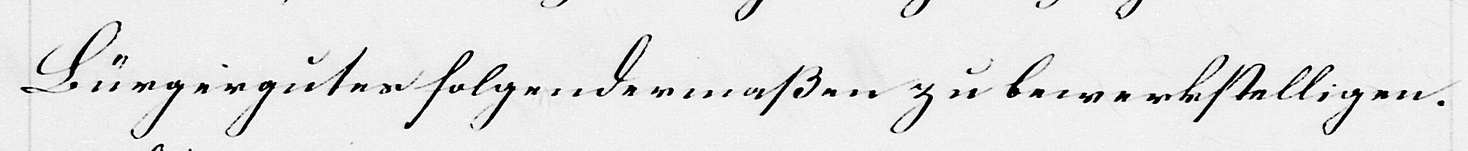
Bürgergutes folgendermaßen zu bewerkstelligen.
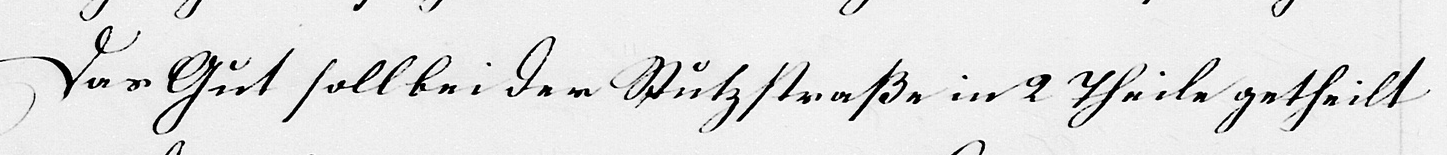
Das Gut soll bei der Stutzstraße in 2 Theile getheilt
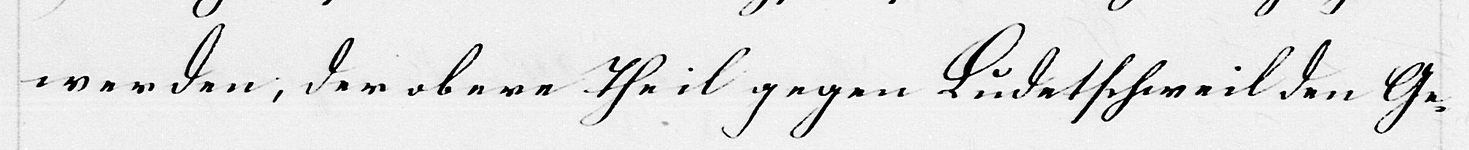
werden, der obere Theil gegen Ludetschweil den Ge¬
